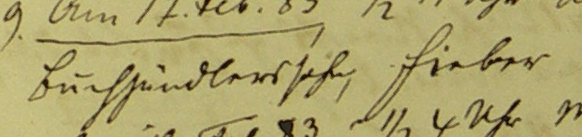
Buchhändlersohn, Fieber
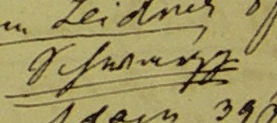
Schwarzgasse
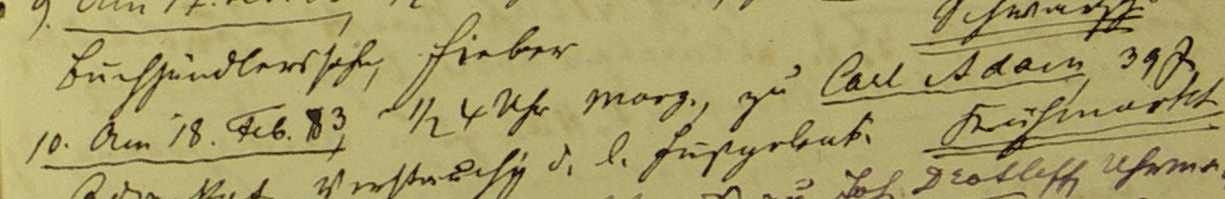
10. Am 18. Febr. 83, ½ 4 Uhr Morg. , zu Carl Adam, 39 J.
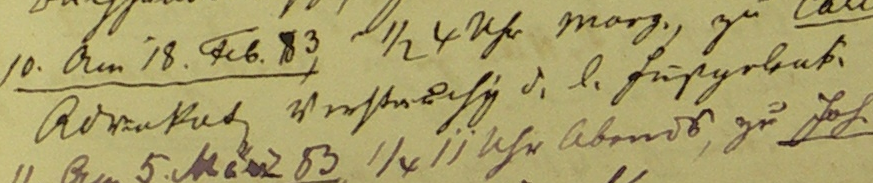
Advokat Verstauchung v. l. Fußgelenk,
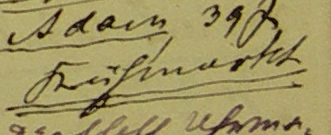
Kühmarkt
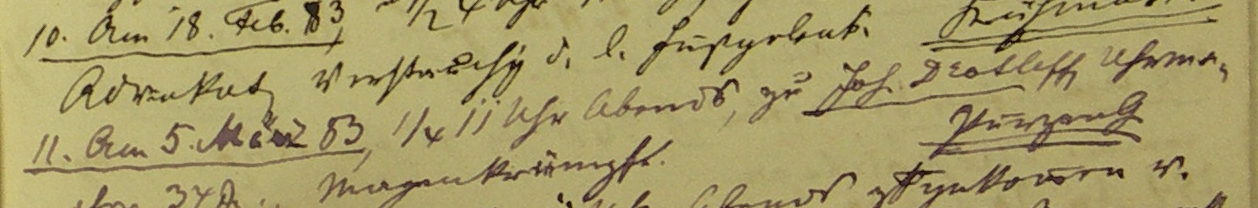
11. Am 5. März 83, ¼ 11 Uhr Abends, zu Joh. Drotleff, Uhrma¬
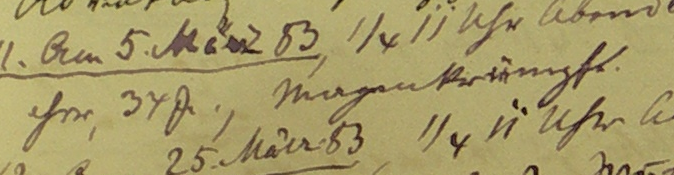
cher 34 J. Magenkrämpfe,
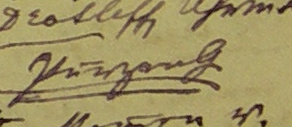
Purzengasse.
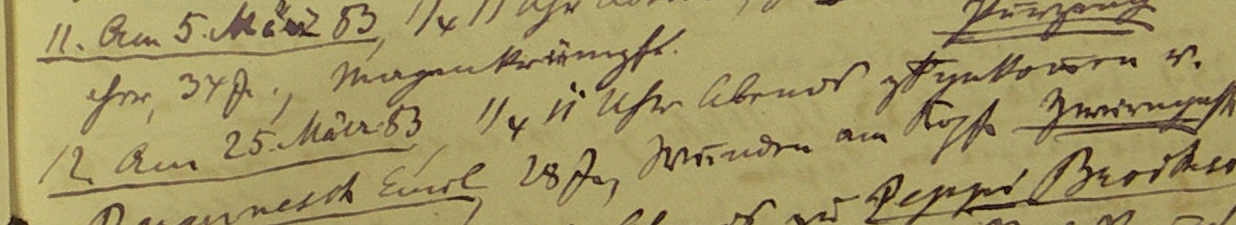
12. Am 25. März 83, ¼ 11 Abends, zusammengkommen v.
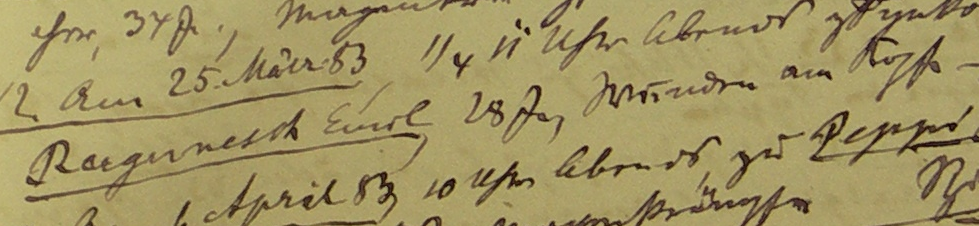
Ragunesch Emil, 28 J. Wunden am Kopf
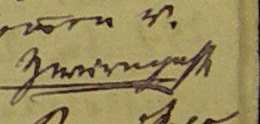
Zwirngasse
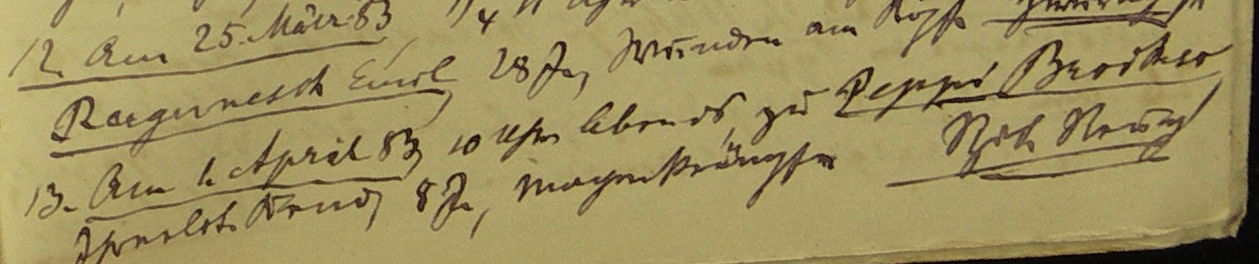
13. Am 1. April 83, 10 Uhr Abends, zu Peppi Broiker,
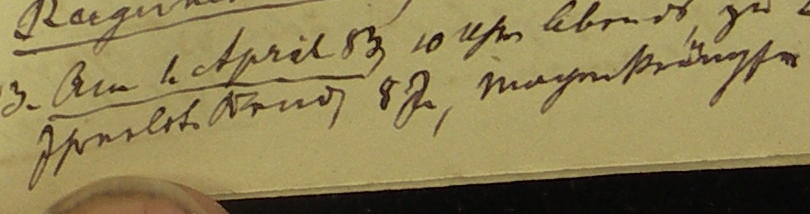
Iperlot Kind, 8. J. Magenkrämpfe
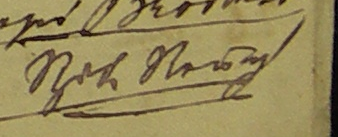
Spit Neug.
